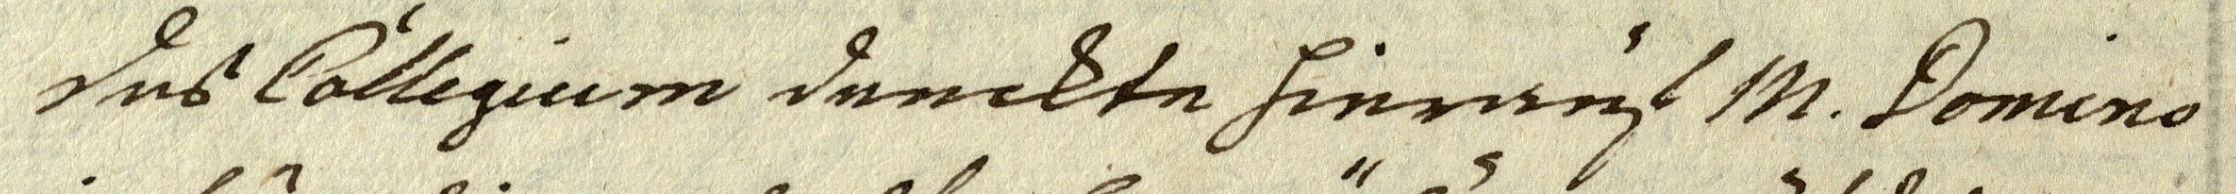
Das Collegium danckte hierauf M. Domino
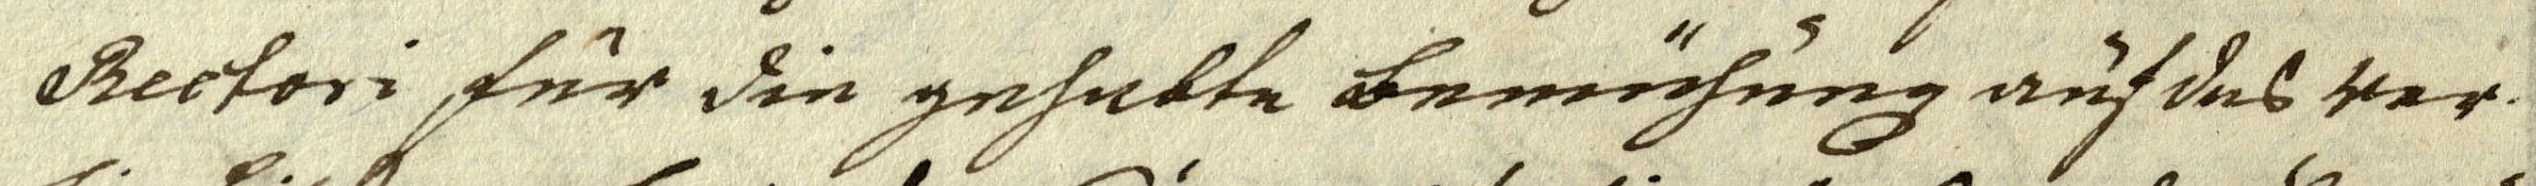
Rectori für die gehabte Bemühung auf das ver¬
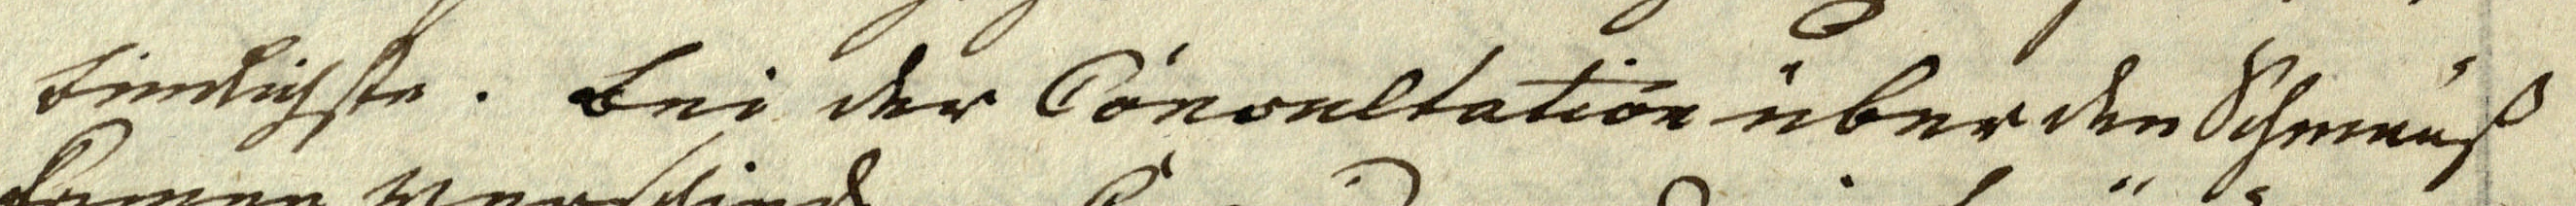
bindlichste. Bei der Consultation über den Schmauß
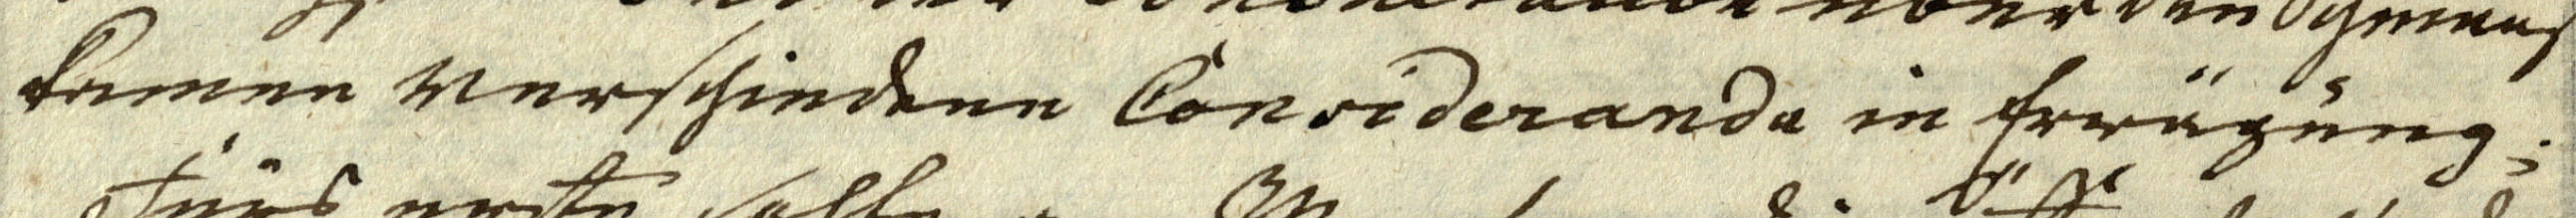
kamen verschiedene Consideranda in Erwägung.
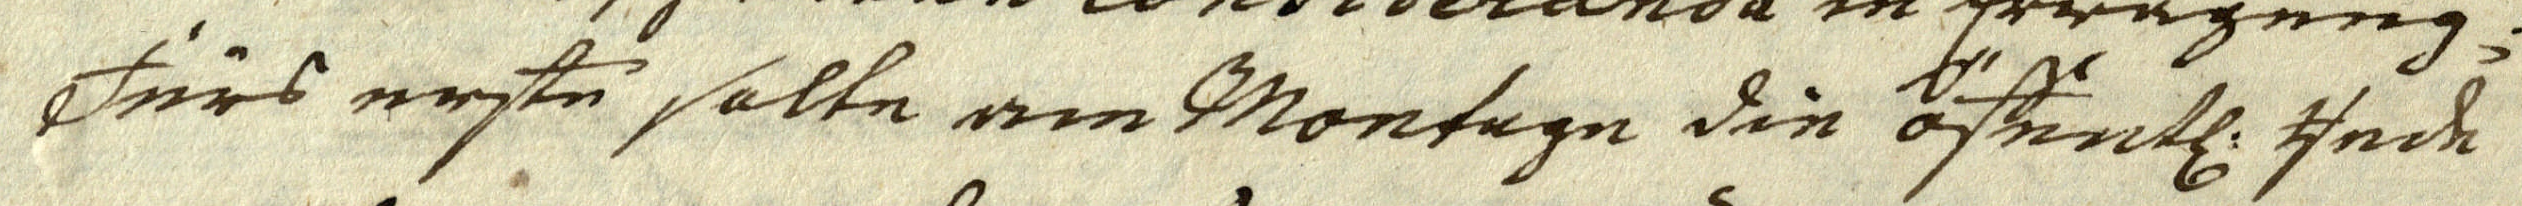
Fürs erste solte am Montage die öffentl. Rede
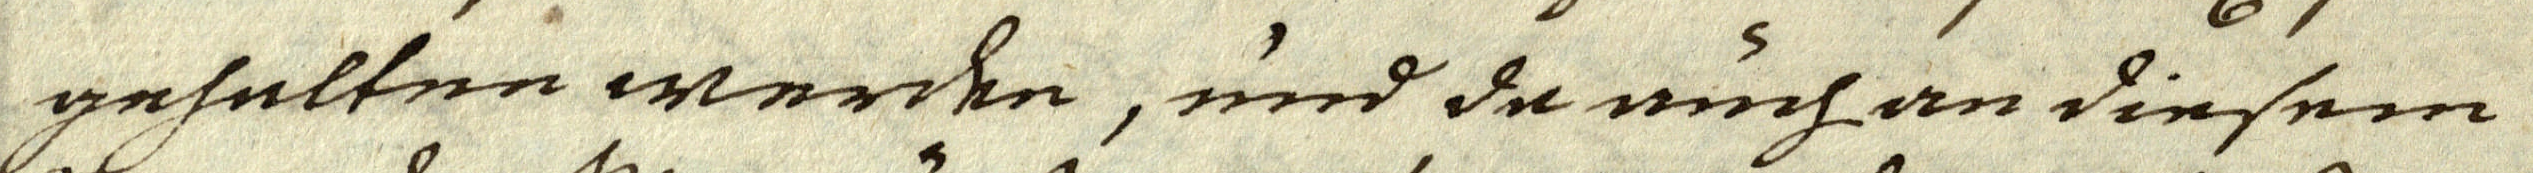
gehalten werden, und da auch an diesem
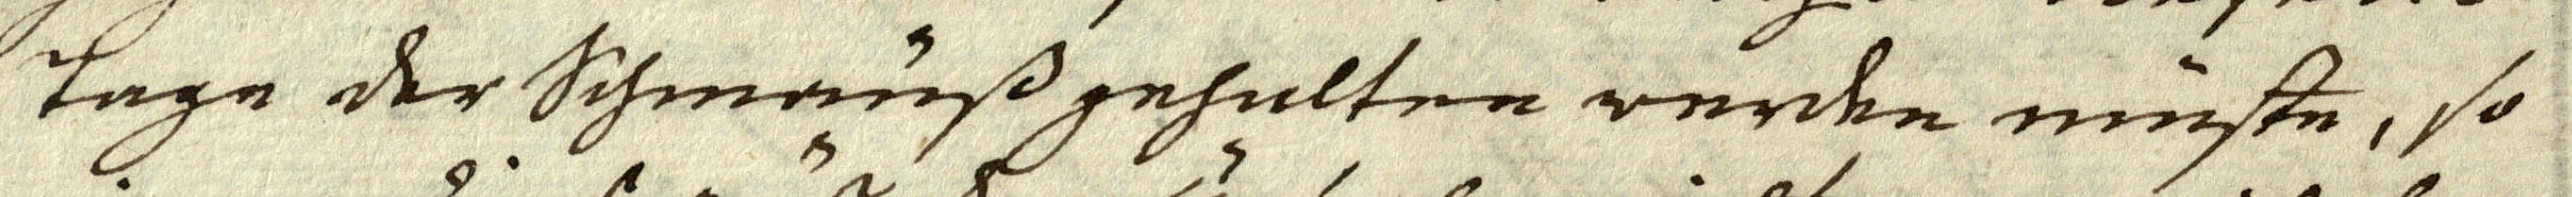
Tage der Schmauß gehalten werden müste, so
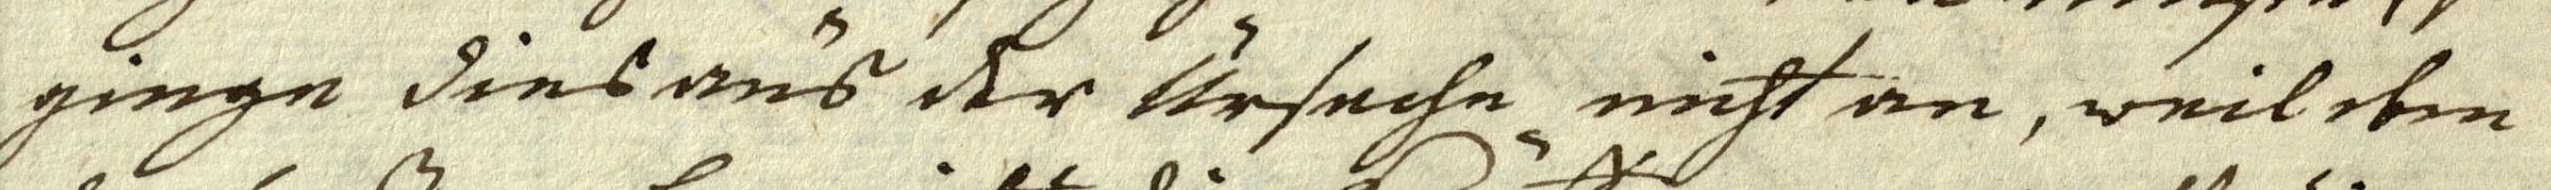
ginge dies aus der Ursache nicht an, weil eben
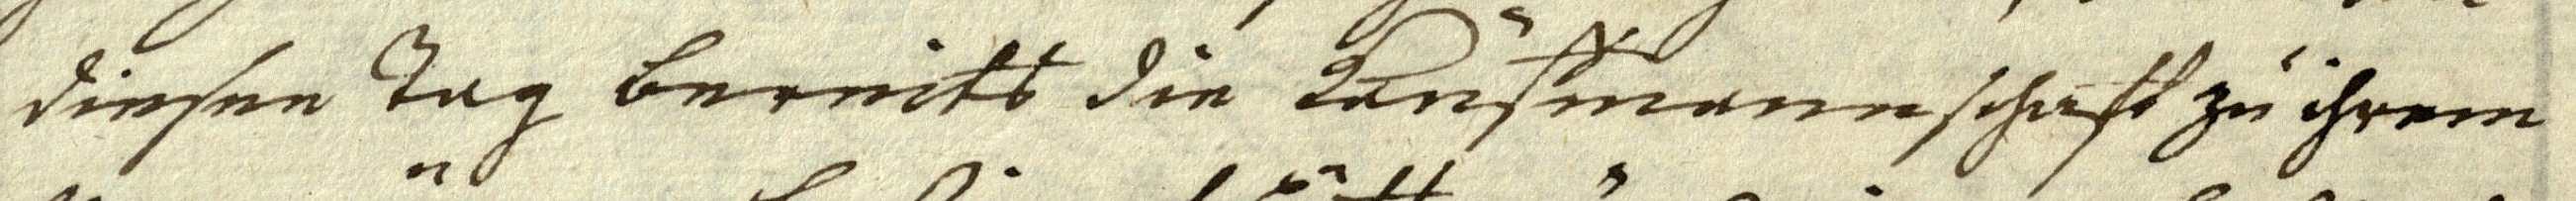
diesen Tag bereits die Kaufmannschaft zu ihrem
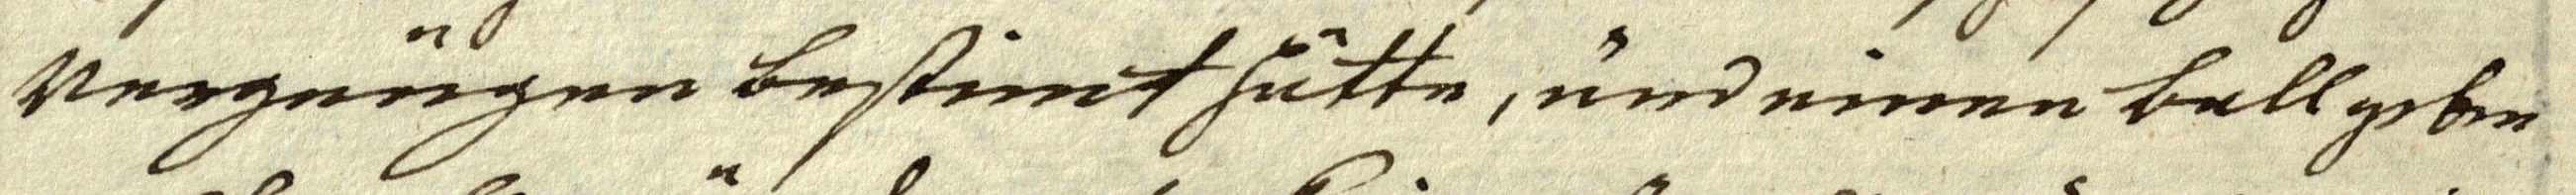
Vergnügen bestimt hätte, und einen Ball geben
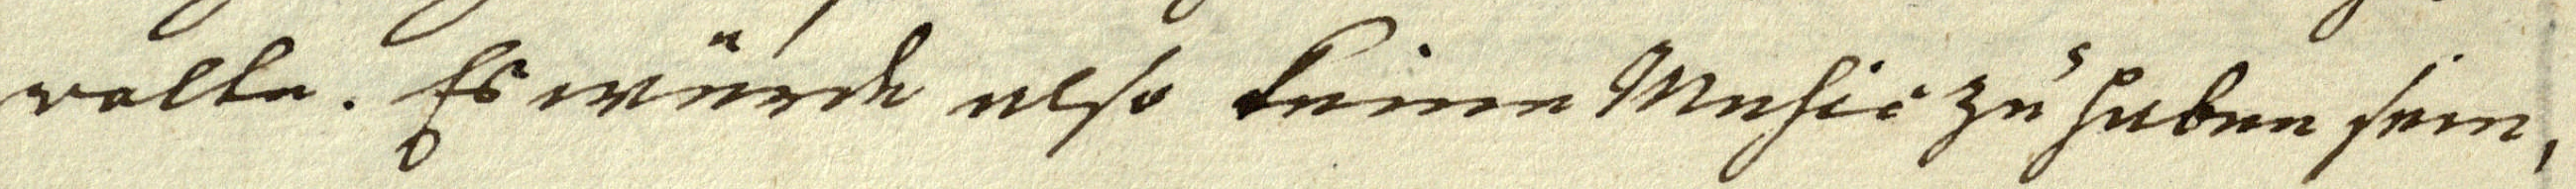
wolle. Es würde also keine Music zu haben sein,
